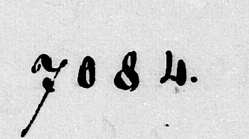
7084.
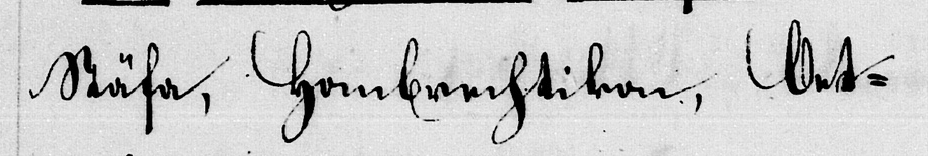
Stäfa, Hombrechtikon, Oet¬
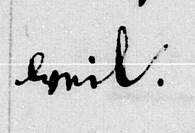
weil.
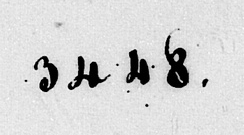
3448.
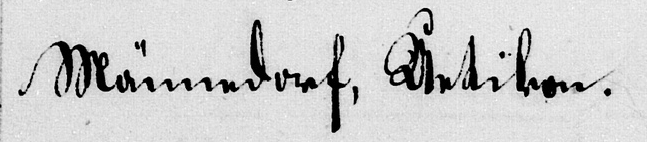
Männedorf, Uetikon.
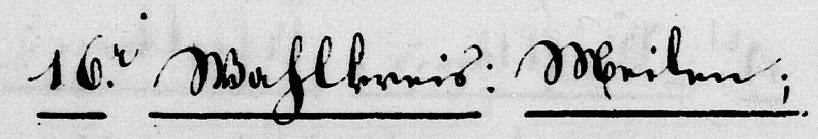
16.r. Wahlkreis: Meilen;
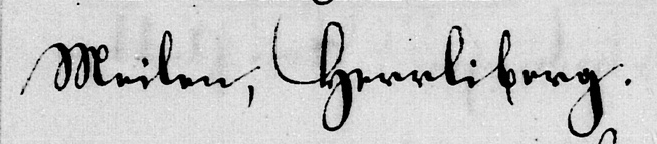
Meilen, Herrliberg.
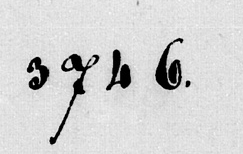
3746.
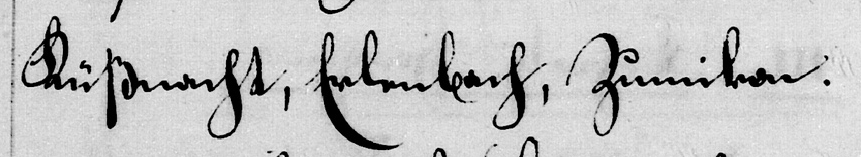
Küßnacht, Erlenbach, Zumikon.
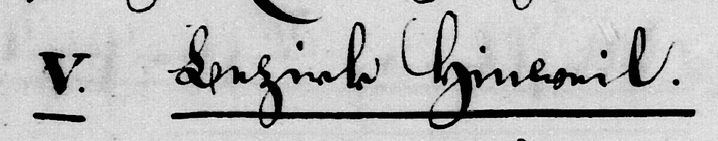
V. Bezirk Hinweil.
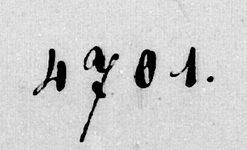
4701.
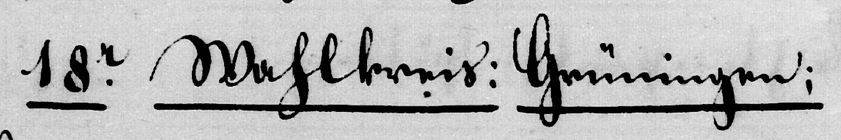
18.r. Wahlkreis: Grüningen;
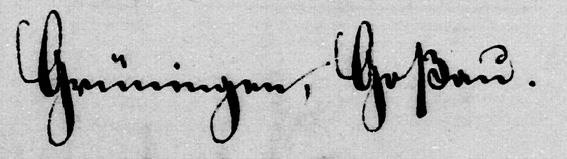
Grüningen, Goßau.
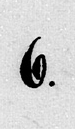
4.
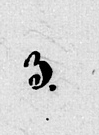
3.
